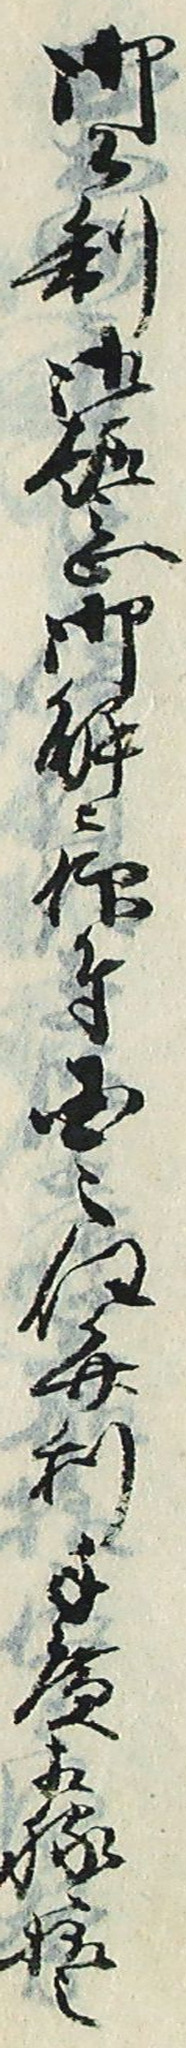御公制御趣意御解被仰付国々任弁利手広相稼候様之
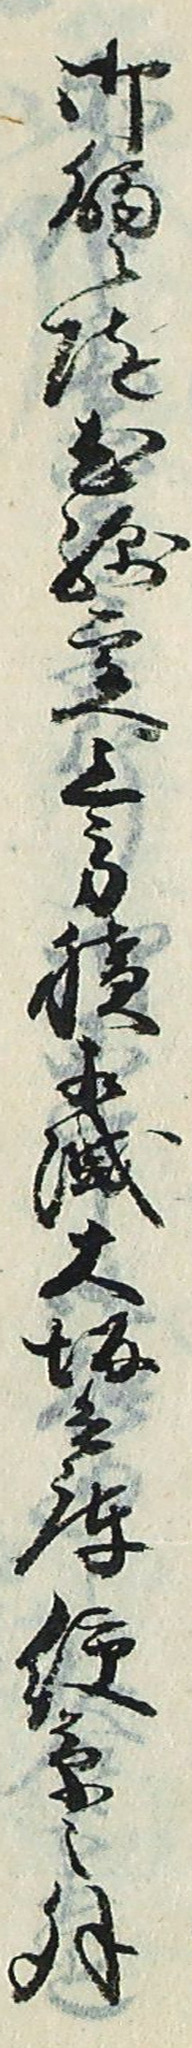御触に随尤綿実上方相減大坂兵庫絞草之外
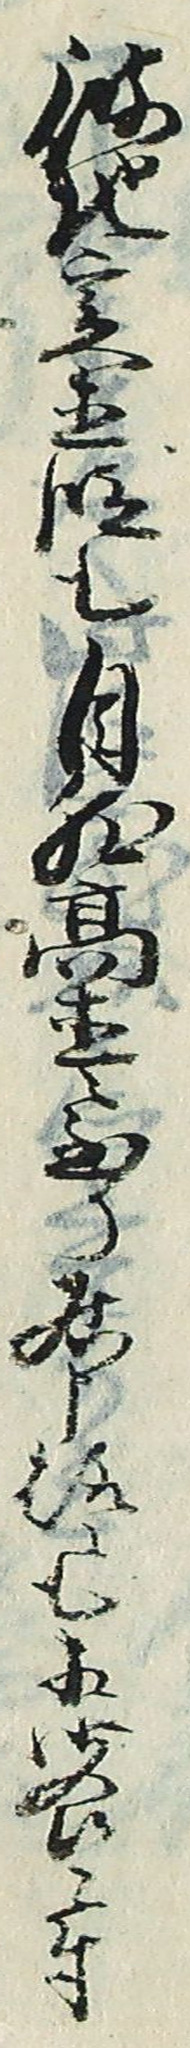彼地実直段も自然高直に至り居申趣にも相聞候に付
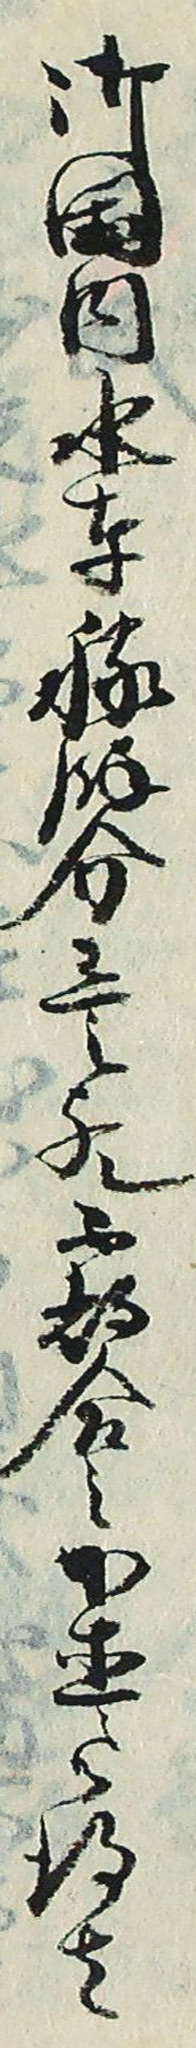御国内水車稼余分有之歟不都合之下直に候得者
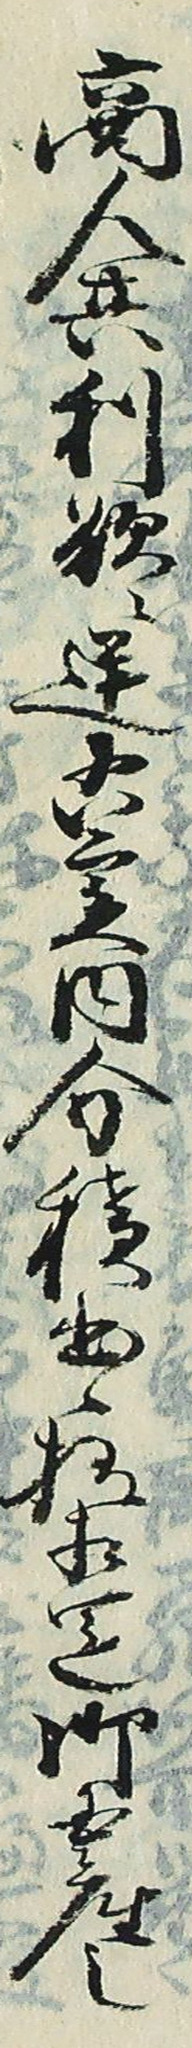商人共利欲に迷右実内分積出候様相運御国産之
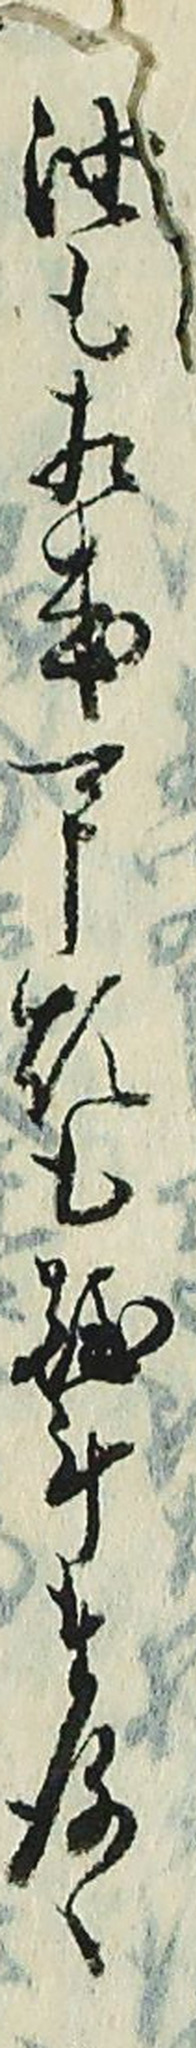油も相成可申煩も難計奉存候
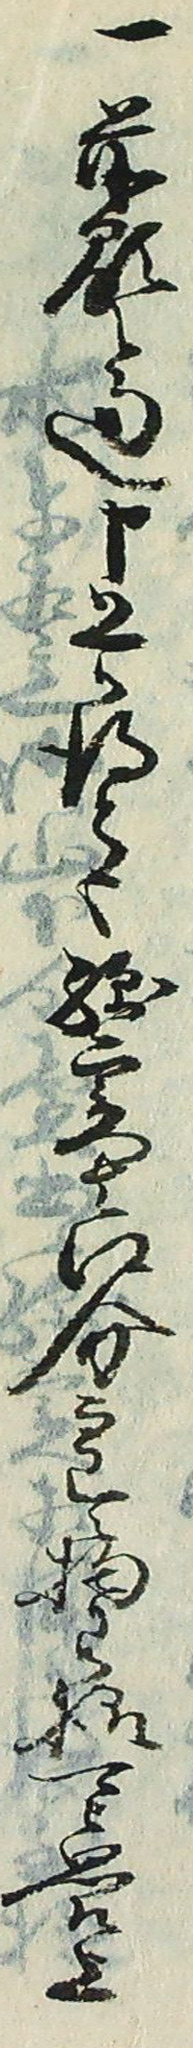一前顕之通申上候得とも綿実者郷分而已に拘り候様可被思召上
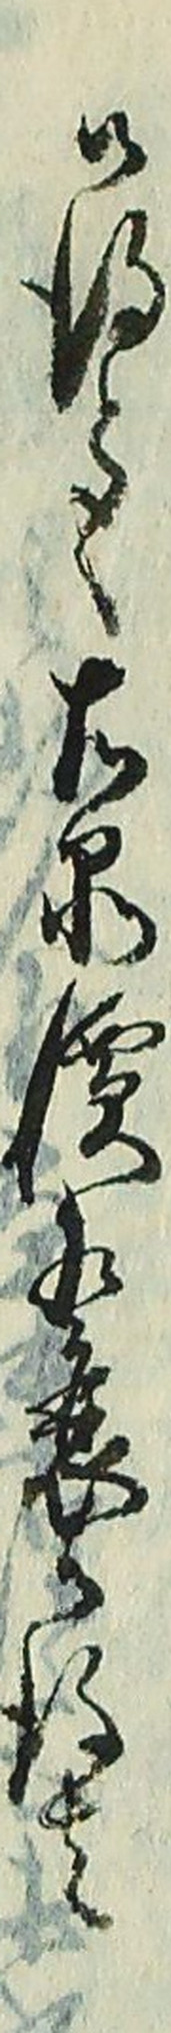候得とも右品価相衰候得者
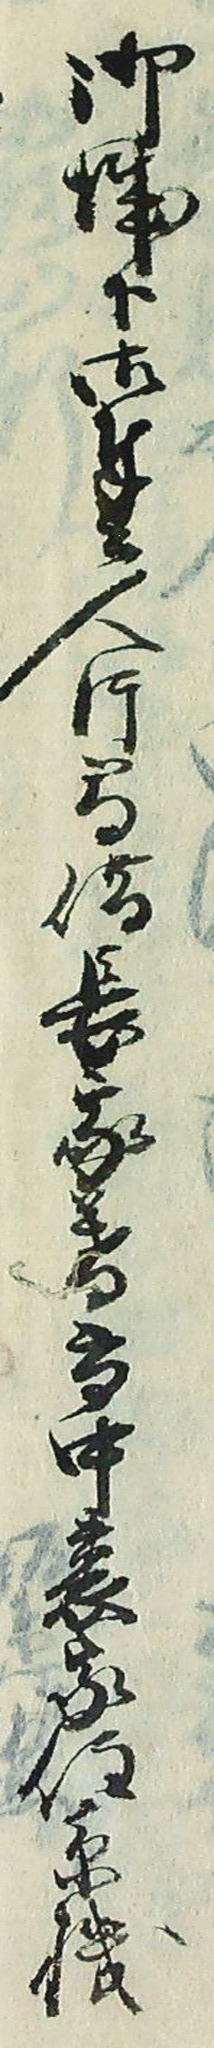御城下御奉公人片間借長屋暮市中裏家住糸機
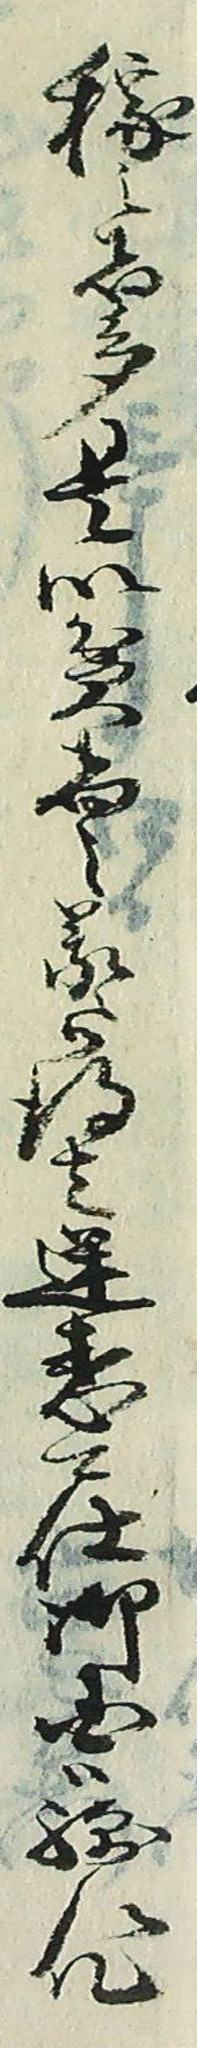稼之者多是以貧者之義に候得者迷惑可仕御国は綿作
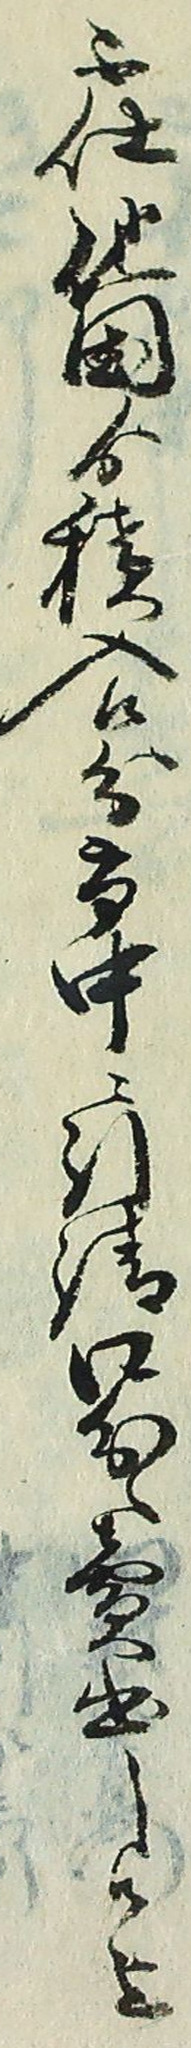不仕他国ゟ積入候分市中に引請郷分へ売出し候上
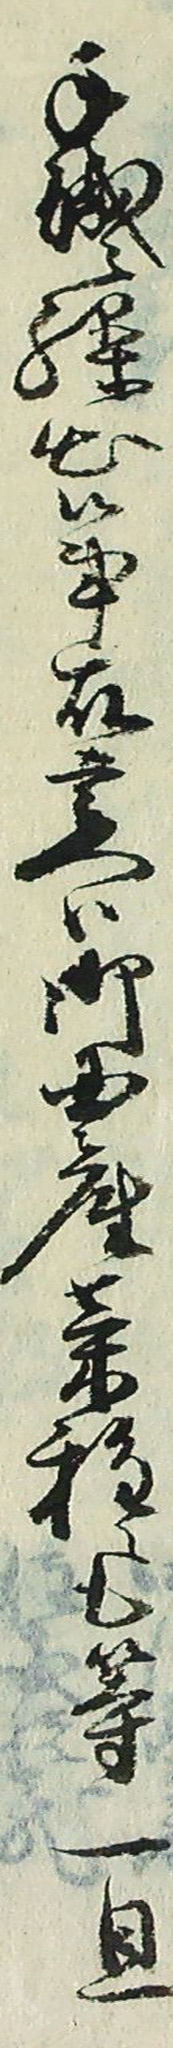手職に繰出候事故実は御国産菜種にも等一旦
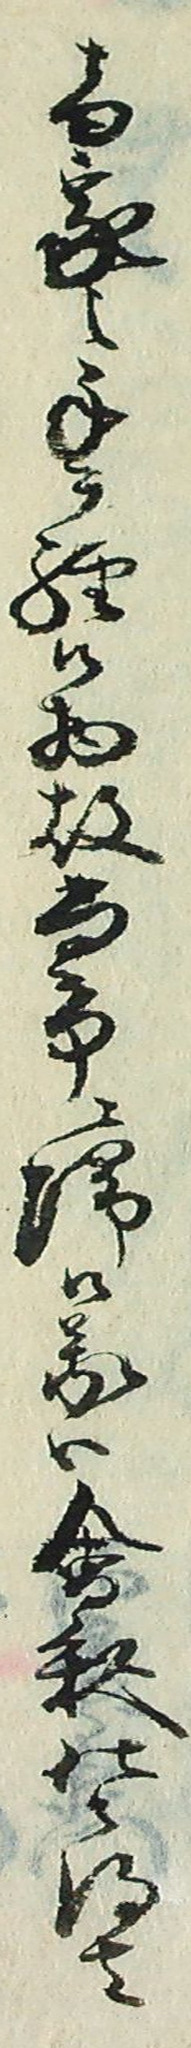商家之手を経候物故尚市に帰候義は会釈仕候得者
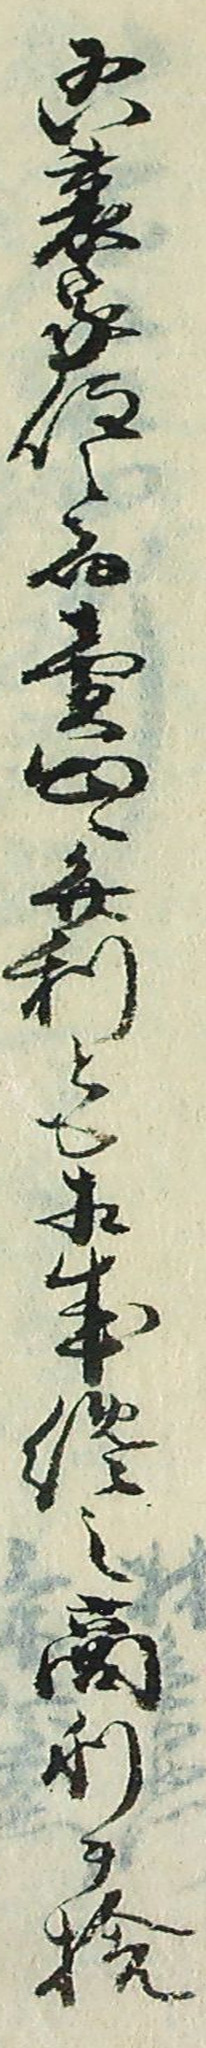右裏家住之者売出候弁利とも相成纔之商利を捨
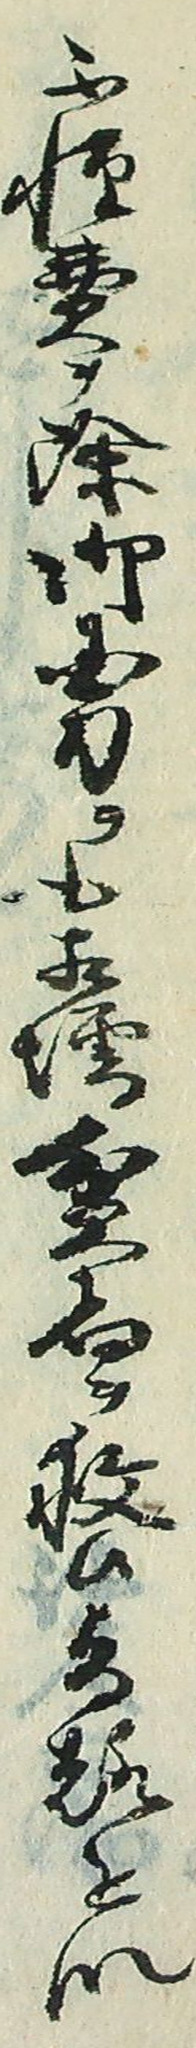不軽費を除御国力をも相増貧者を救候旨趣を以
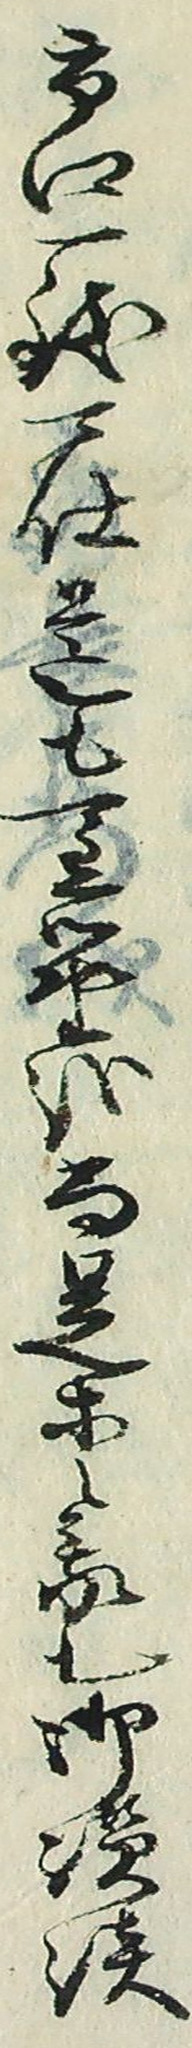市郷一致可仕道も可有御坐哉尚是等之義も御讃談
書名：油稼御取究ニ附御箇條書テ以被仰渡南北同役申談御答書控
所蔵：鳴門教育大学 Naruto University of Education
